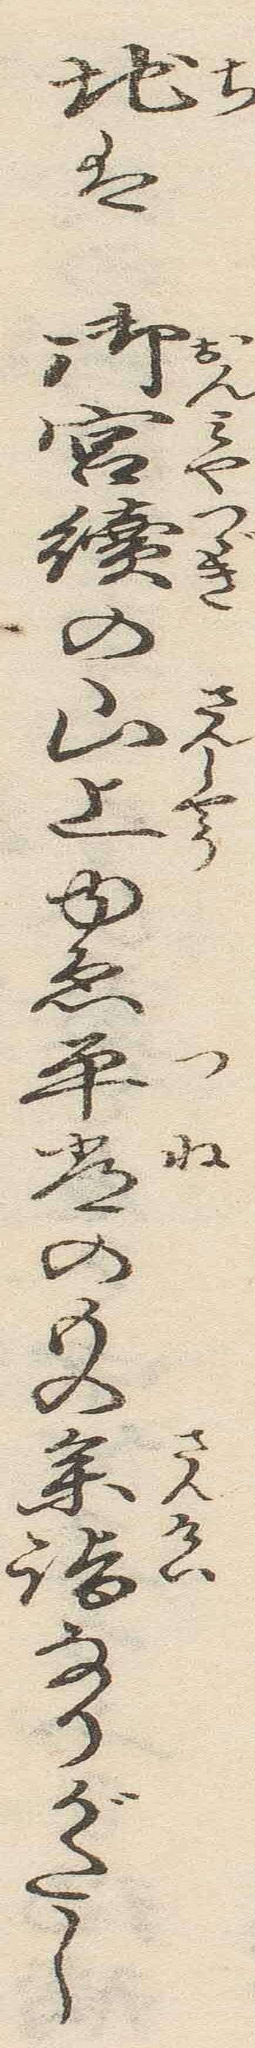地は御宮續の山上ゆゑ平常のもの参詣なりがたし
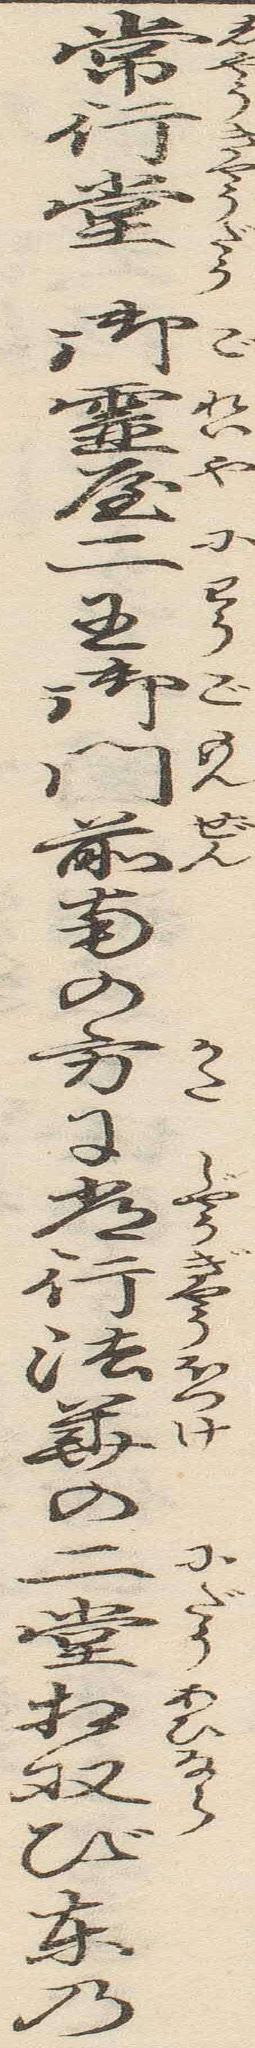常行堂御靈屋二王御門前南の方に常行法華の二堂相双び東の
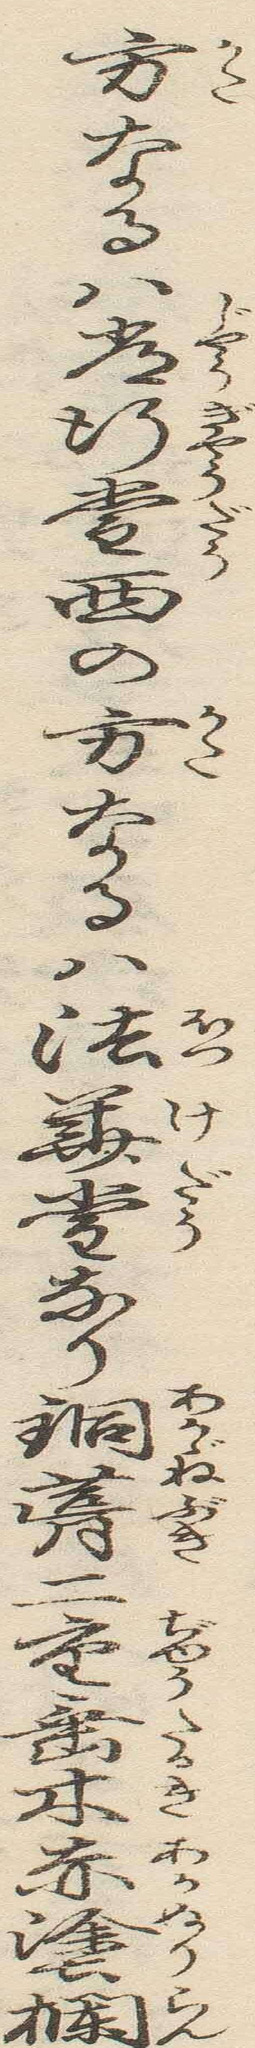方なるは常行堂西の方なるは法華堂なり銅葺二重垂木赤塗欄
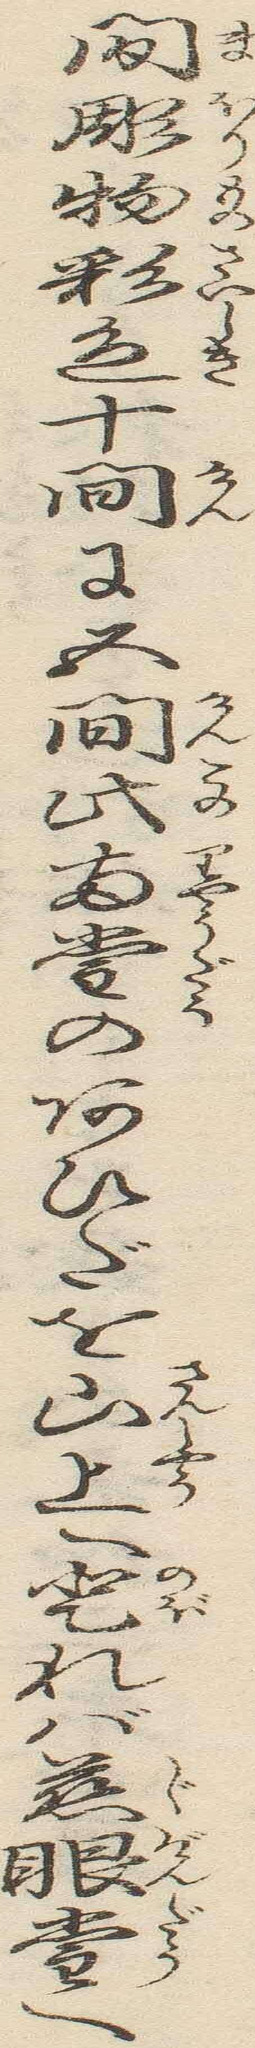間彫物彩色十間に五間此両堂のあひだを山上へ登れば慈眼堂へ
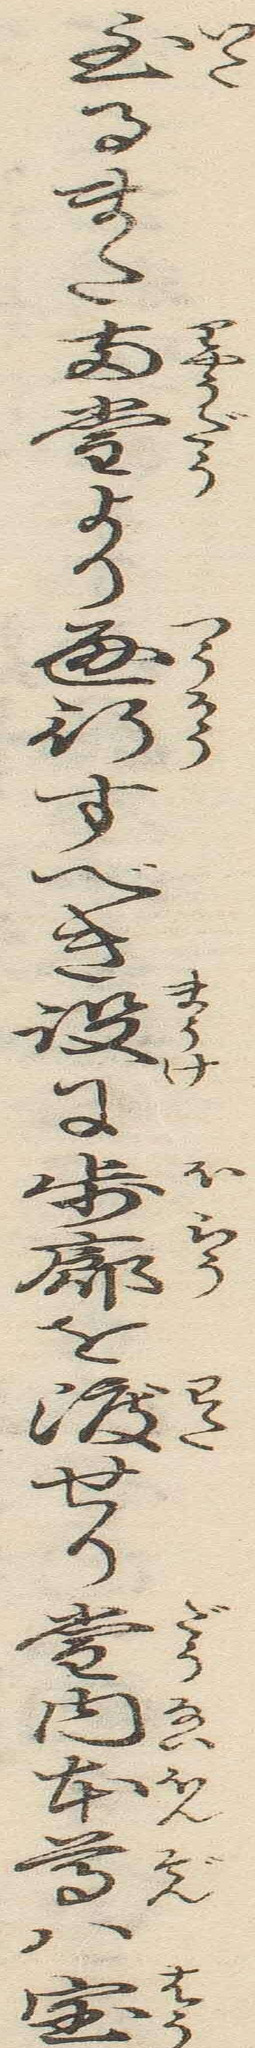至るまた両堂より通行すべき設に歩廊を渡せり堂内本尊は宝
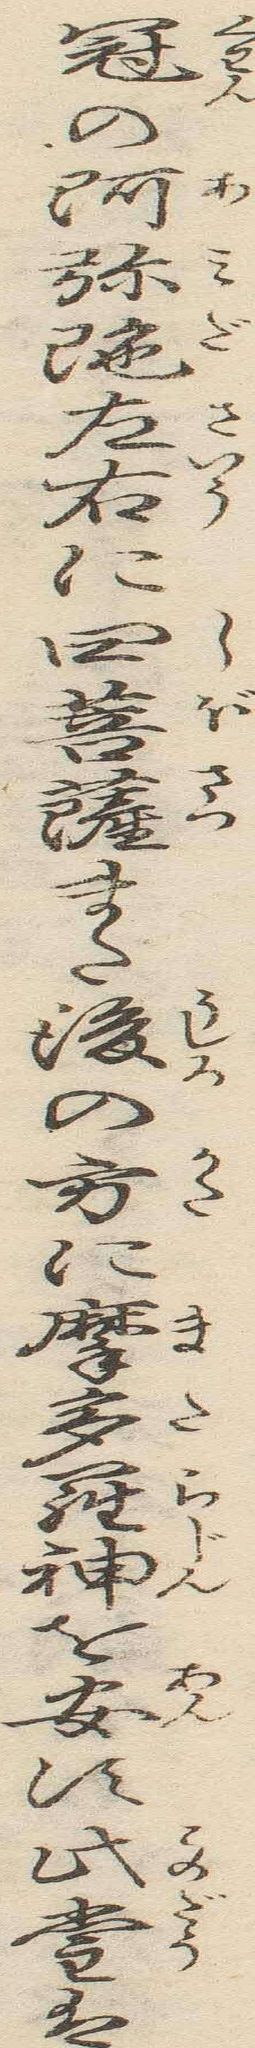冠の阿弥陀左右に四菩薩また後の方に摩多羅神を安す此堂は
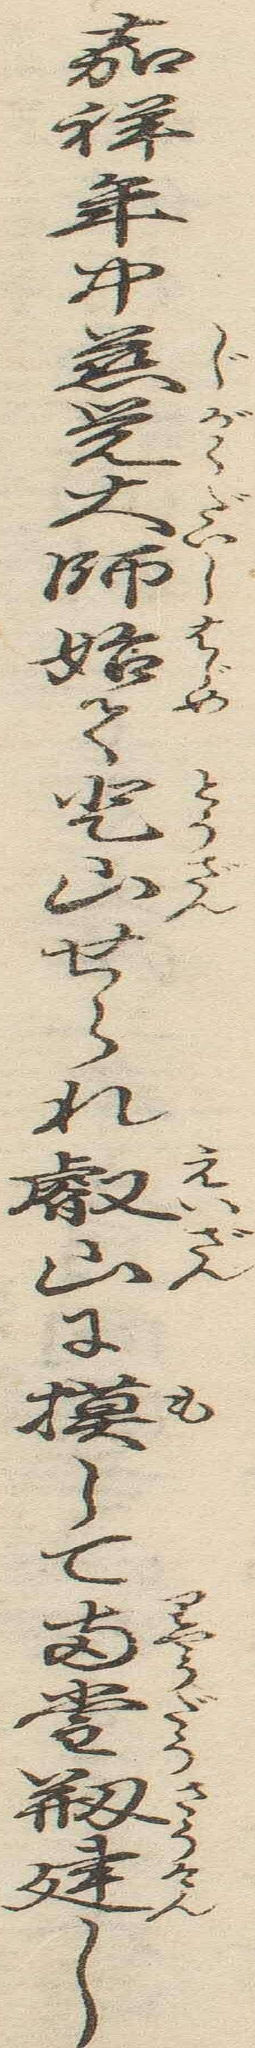嘉祥年中慈覚大師始て登山せられ叡山に摸して両堂剏建し
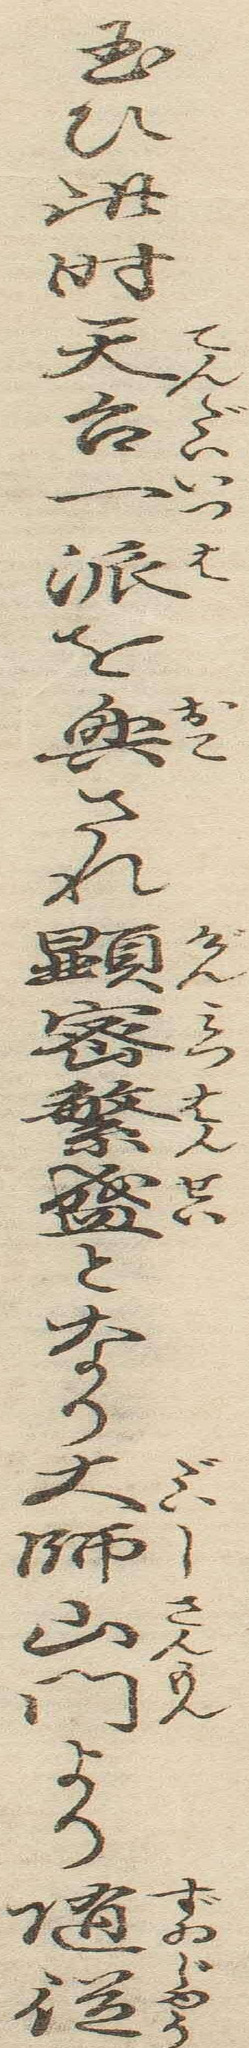玉ひ此时天台一派を興され顕密繁盛となり大師山門より随従
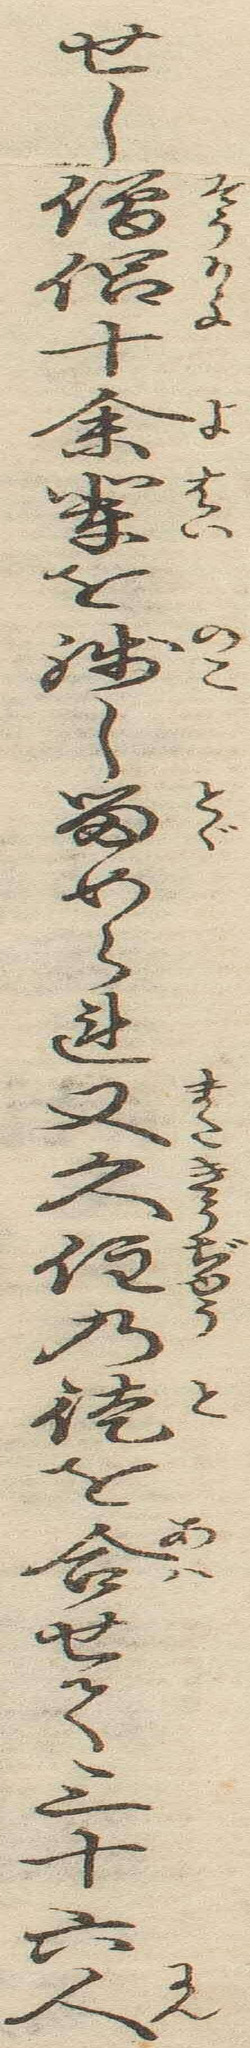せし僧侶十余輩を残し留められ又久住の徒を合せて三十六人

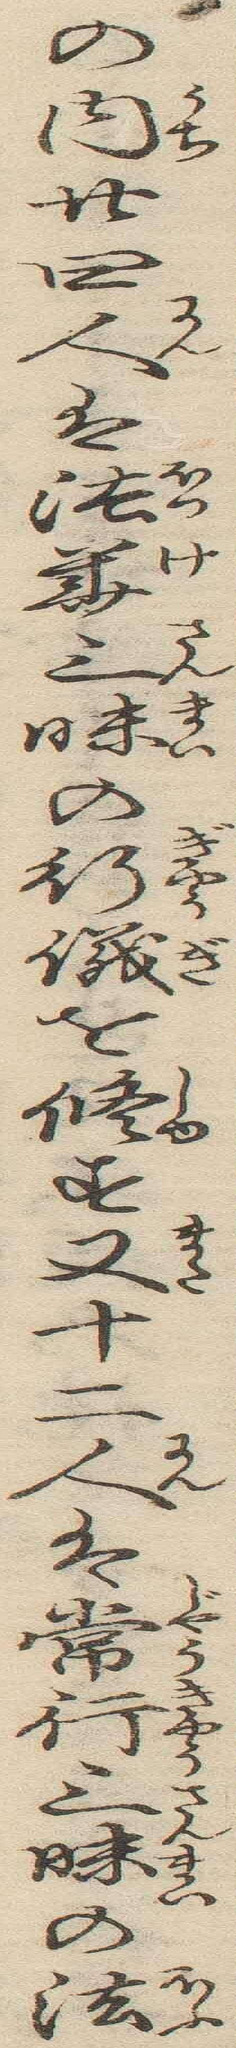の内廿四人は法華三昧の行儀を修す又十二人は常行三昧の法
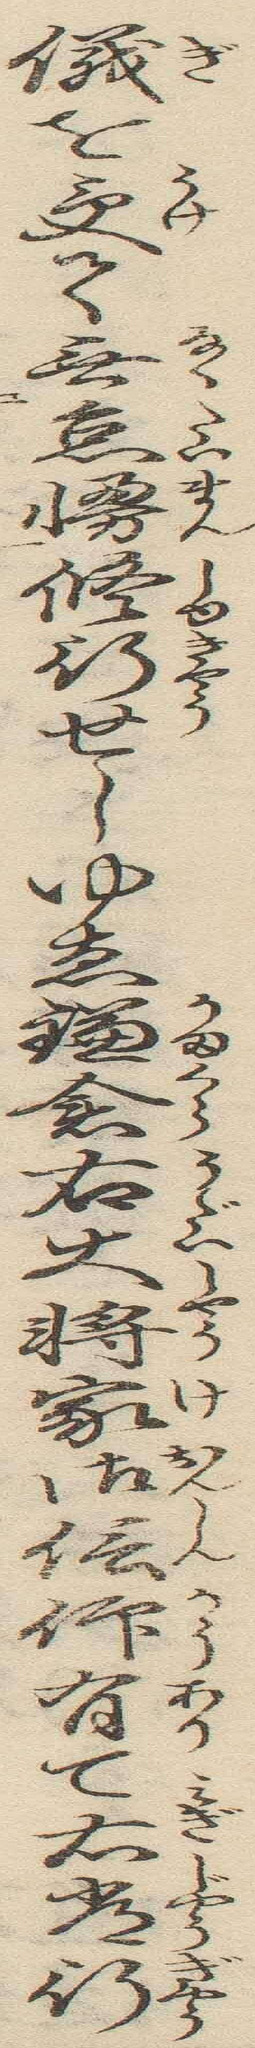儀を受て無怠慢修行せしゆゑ鎌倉右大將家御信仰有て右常行
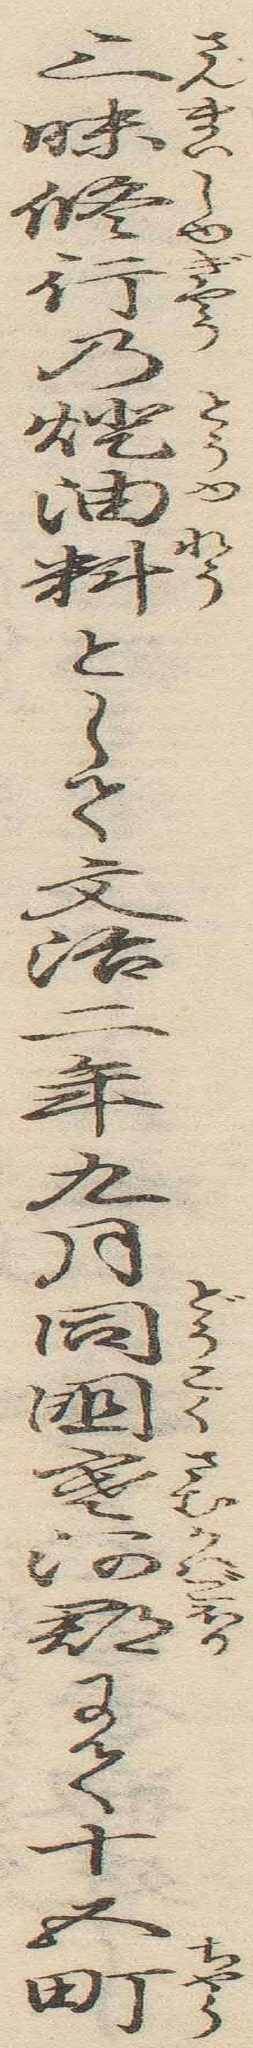三昧修行の燈油料として文治二年九月同國寒河郡にて十五町
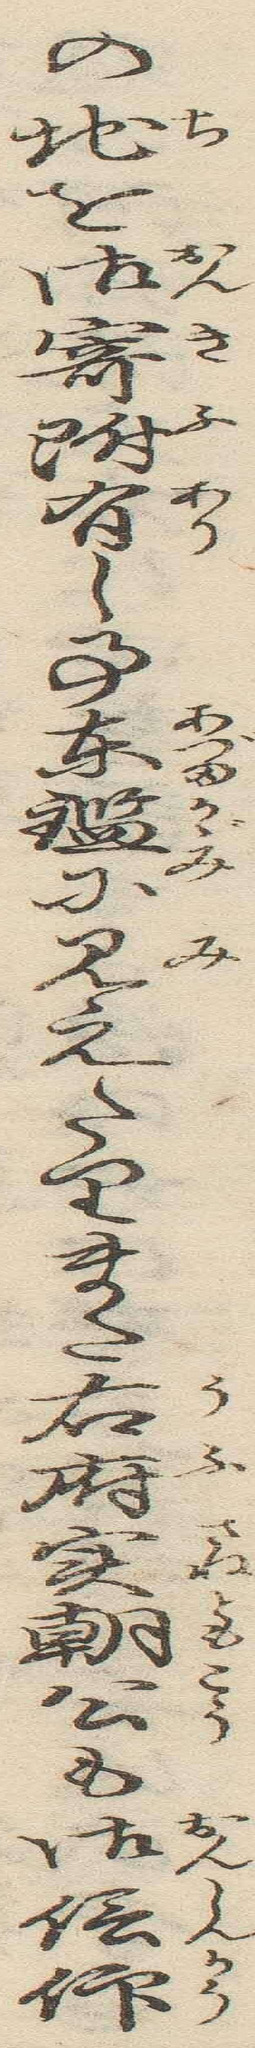の地を御寄附有し事東鑑に見えたりまた右府実朝公も御信仰
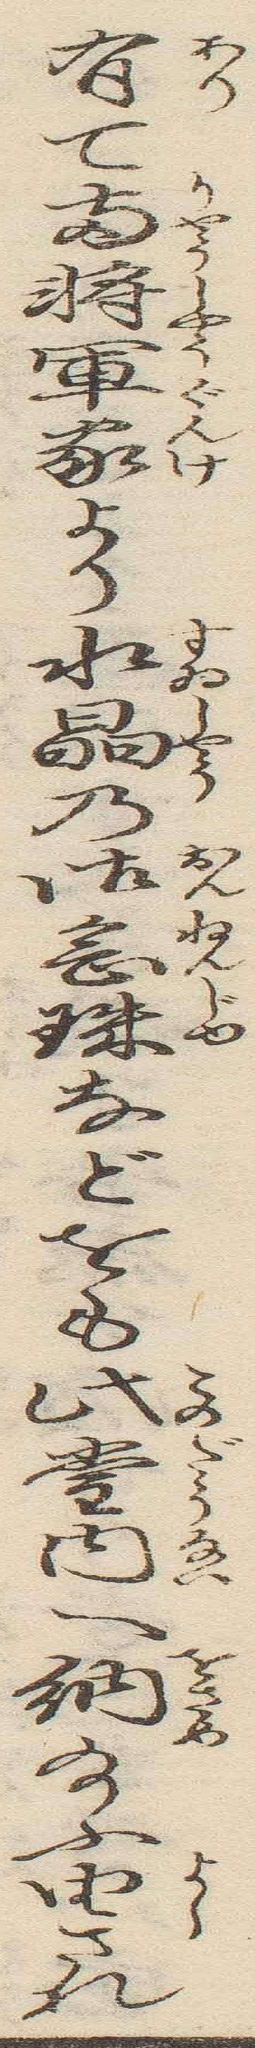有て両將軍家より水晶の御念珠などをも此堂内へ納給ふ由され
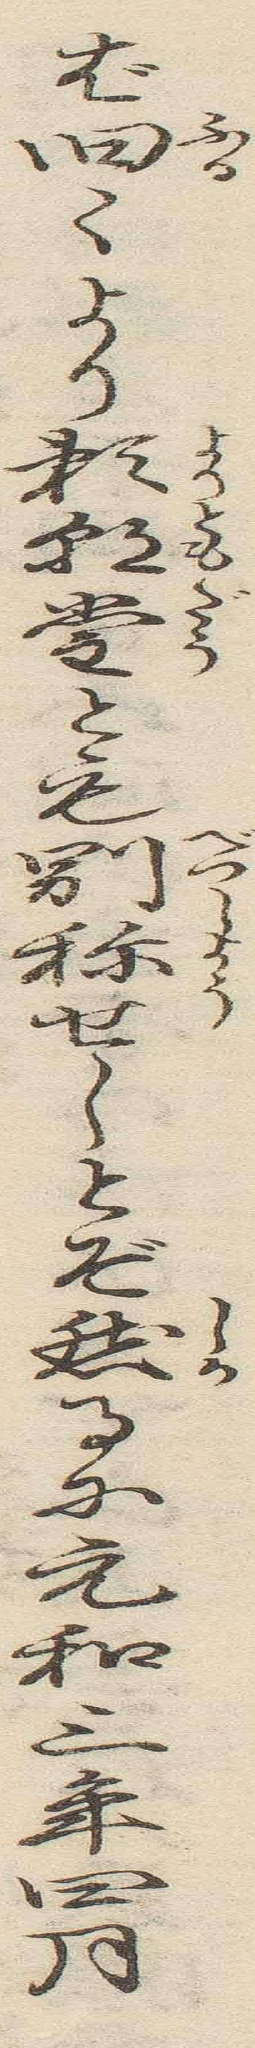ば旧くより頼朝堂とも別称せしとぞ然るに元和三年四月
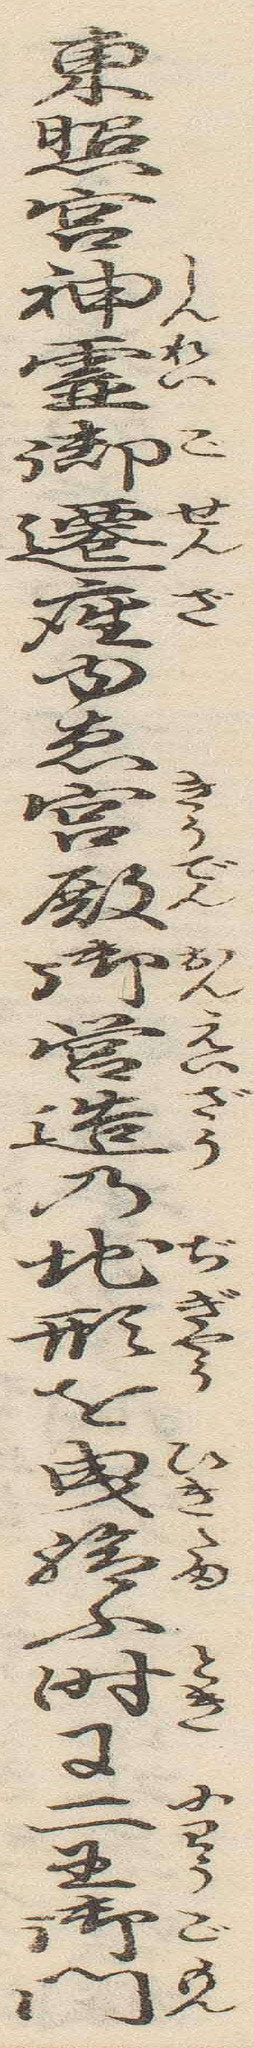東照宮神霊御遷座ゆゑ宮殿御営造の地形を曳給ふ时に二王御門
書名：日光山志
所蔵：東京学芸大学附属図書館 国文学研究資料館
